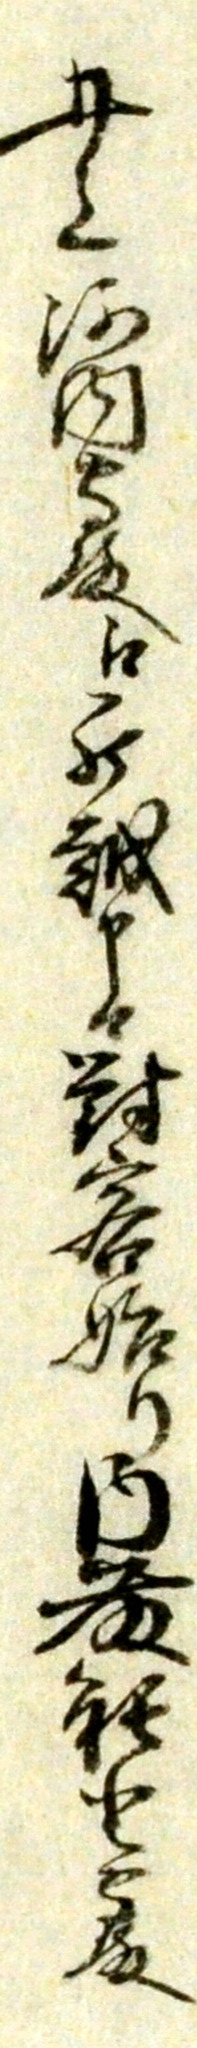井上河内守殿江罷越申候対客始り内藤能登守殿
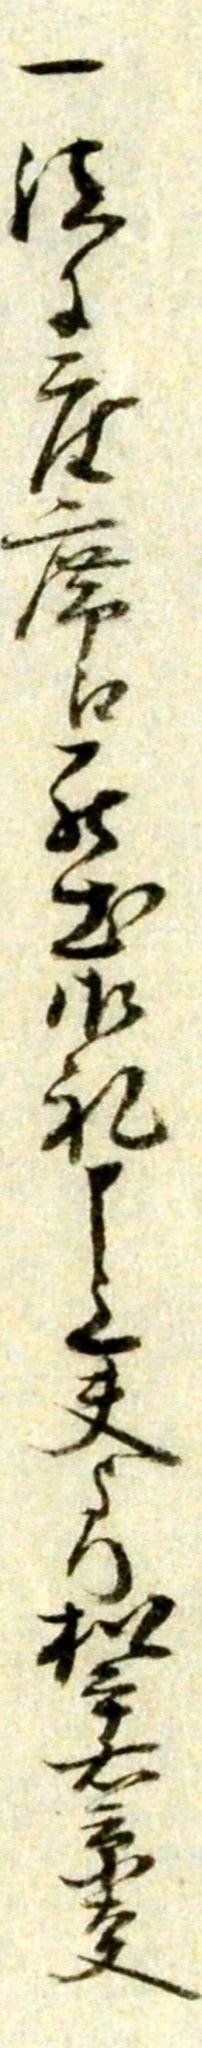一緒に座席江罷出御礼申上夫より松平右京太夫
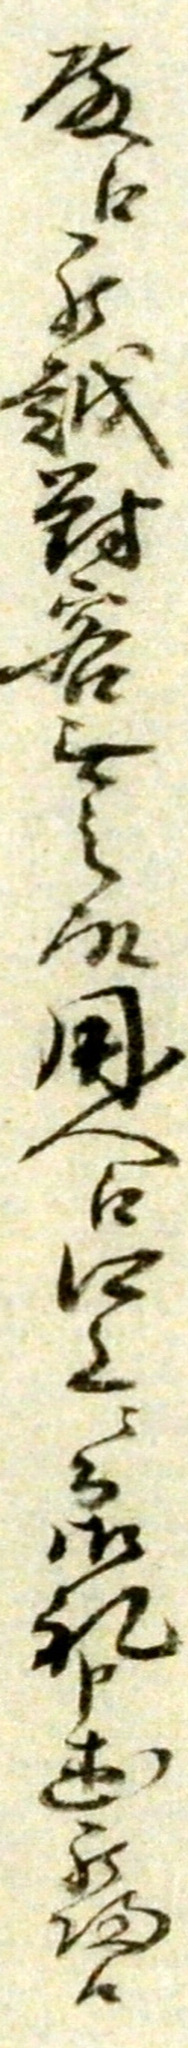殿江罷越対客無之故用人江口上ニ而御礼申述罷帰ㇽ
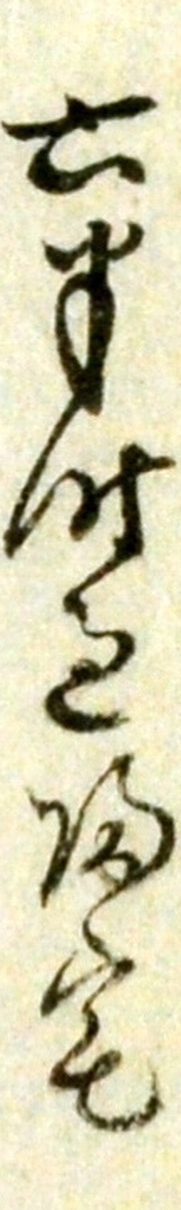六半時過帰宅
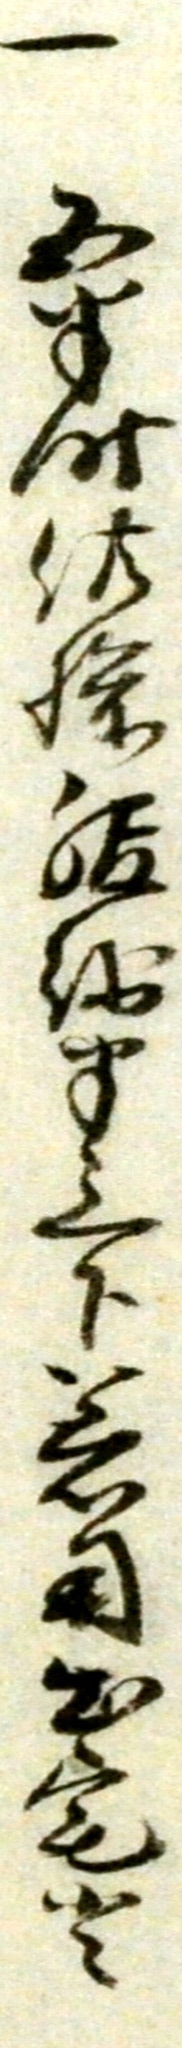一五半時供揃服紗半上下着用出宅登

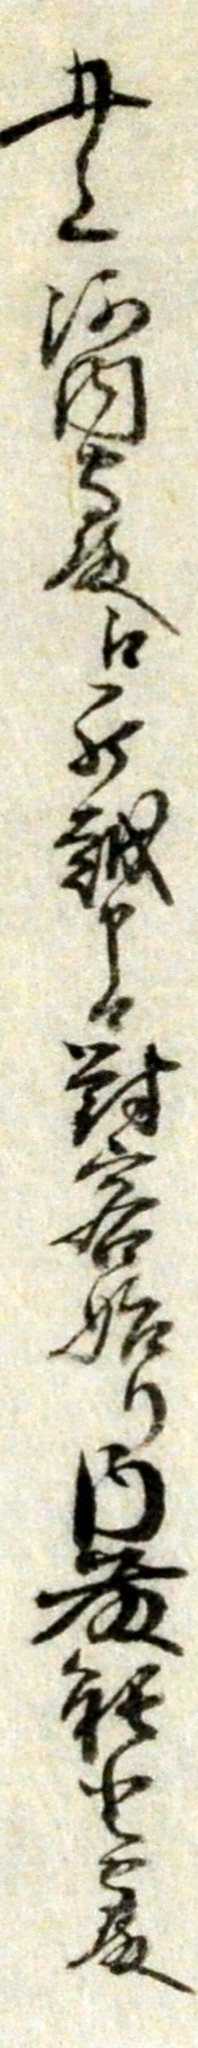井上河内守殿江罷越申候対客始り内藤能登守殿
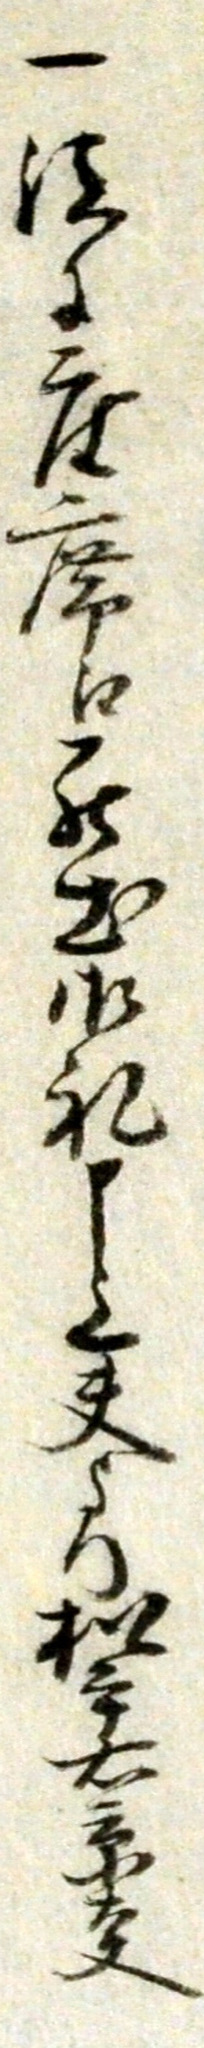一緒に座席江罷出御礼申上夫より松平右京太夫
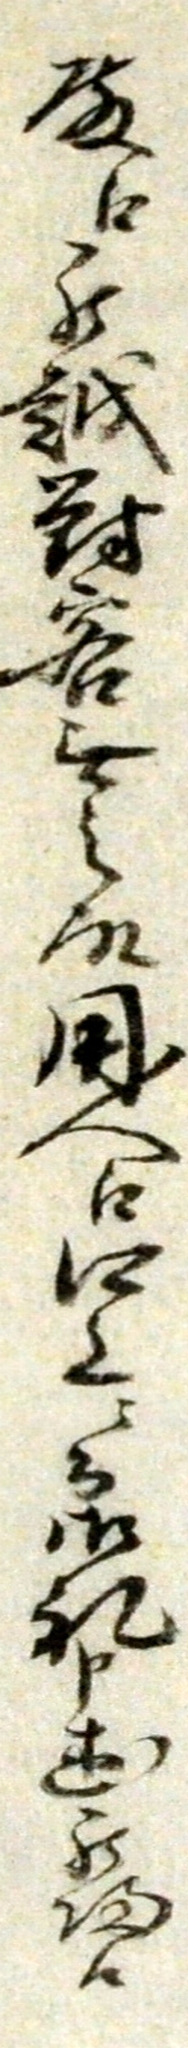殿江罷越対客無之故用人江口上ニ而御礼申述罷帰候
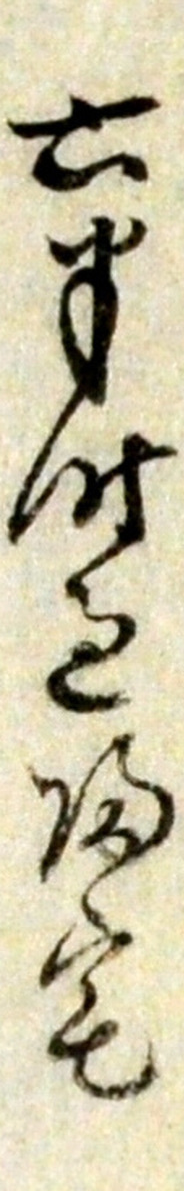六半時過帰宅
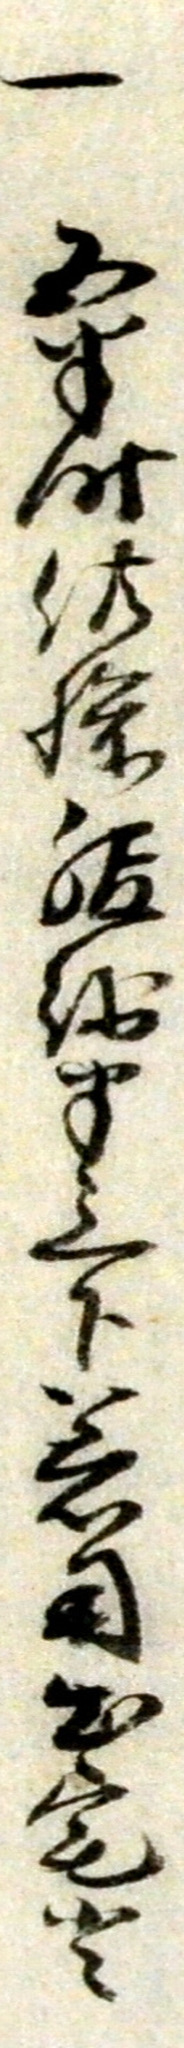一五半時供揃服紗半上下着用出宅登
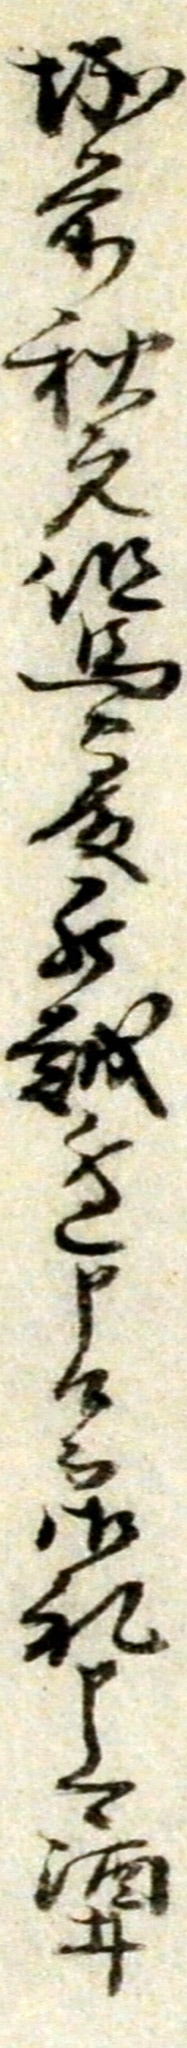城前秋元但馬守殿罷越逢申候而御礼申上候酒井
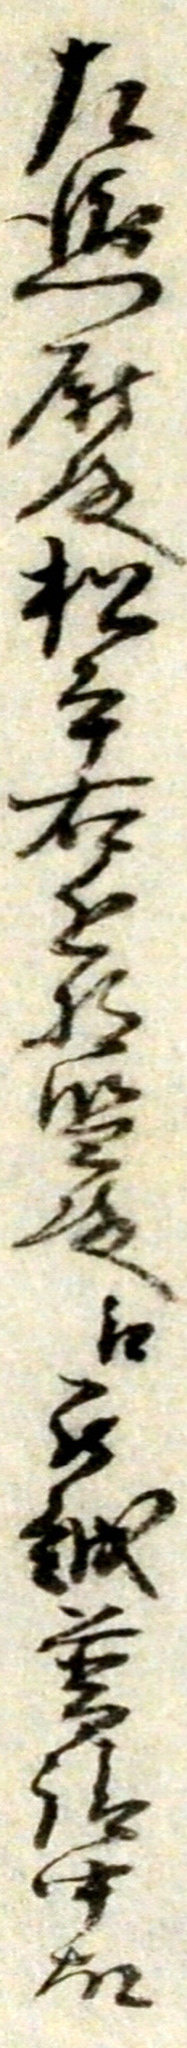左衛門尉殿松平右近将監殿江罷越普請中故
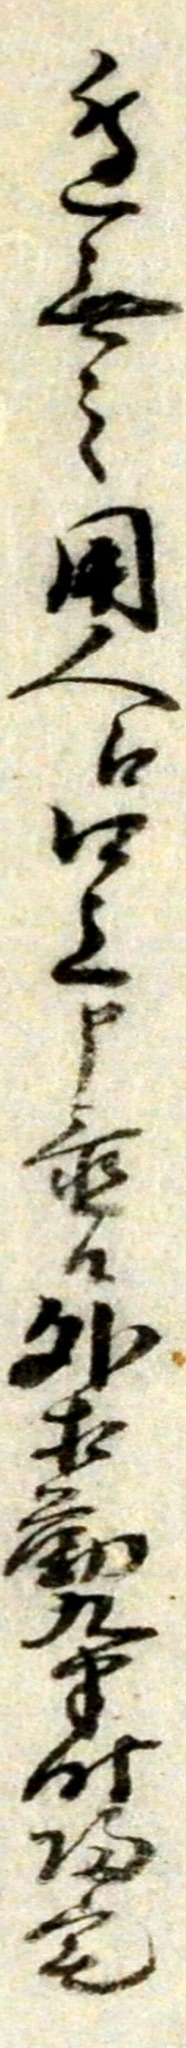逢無之用人江口上申置候外相勤九半時帰宅
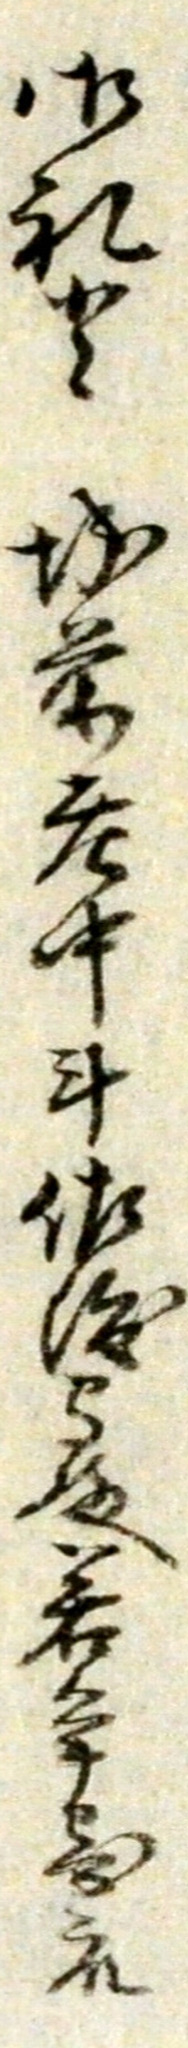御礼登城前老中佐渡守殿若年寄衆
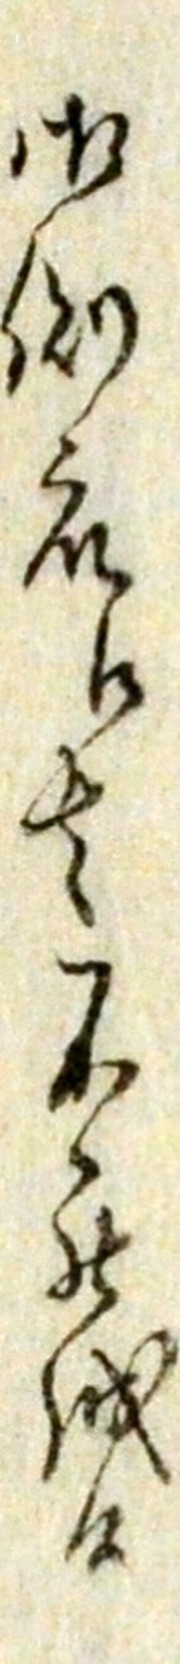御側衆江者不罷越候
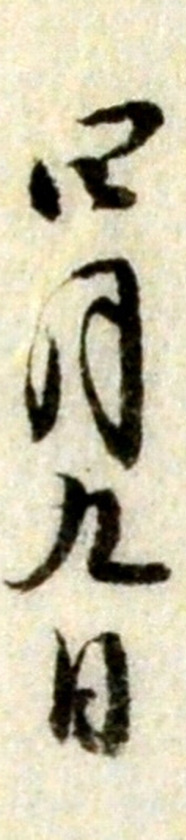四月九日
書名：日光御名代相勤候節ノ留
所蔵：伊那市立高遠町図書館・合同会社AMANE
